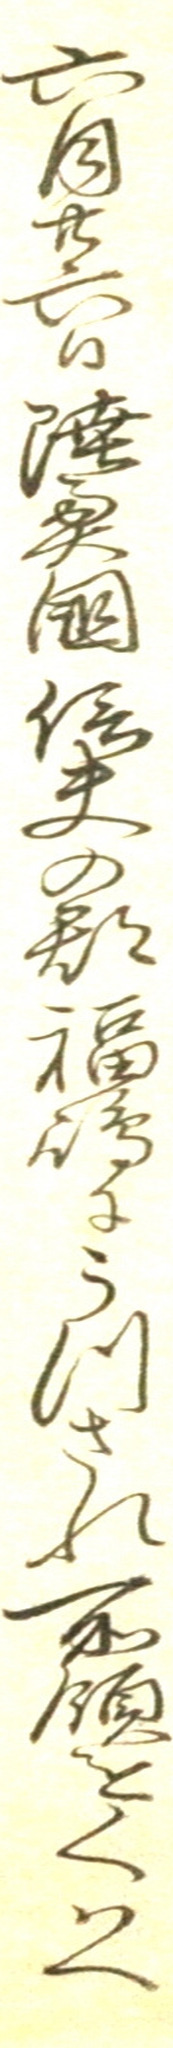六月廿六日陸奥国信夫の郡福島にうつされ所領をくはへ
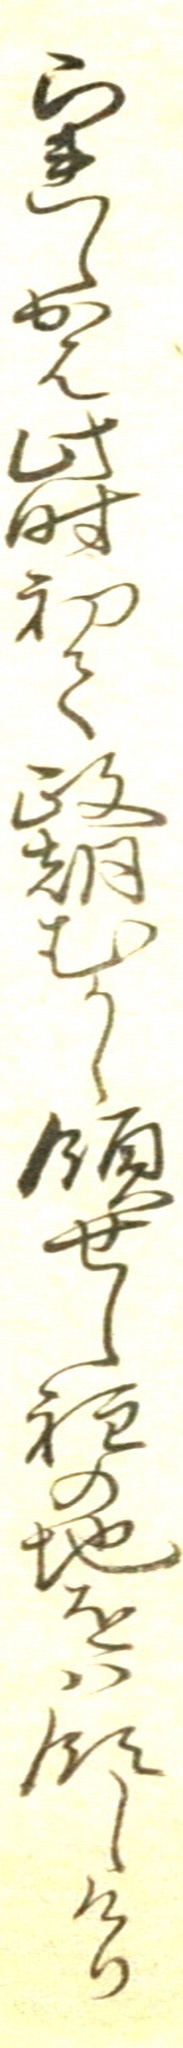られしかは此時初て政朝むかし領せし程の地をは領しけり
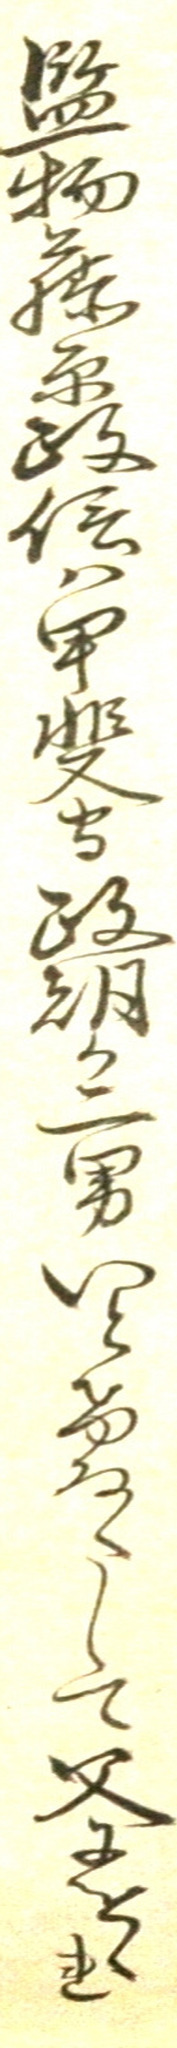監物藤原政信は甲斐守政朝か二男いとけなくして父にをくれ
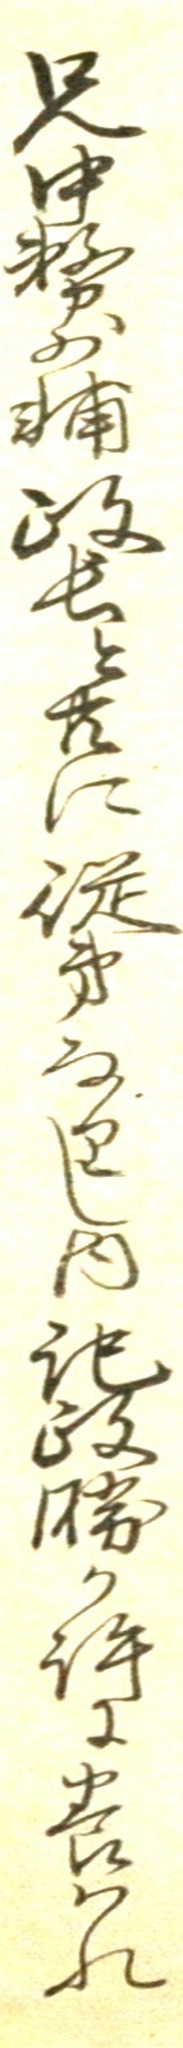兄中務少輔政長と共に従弟なりし内記政勝か許に養はれ
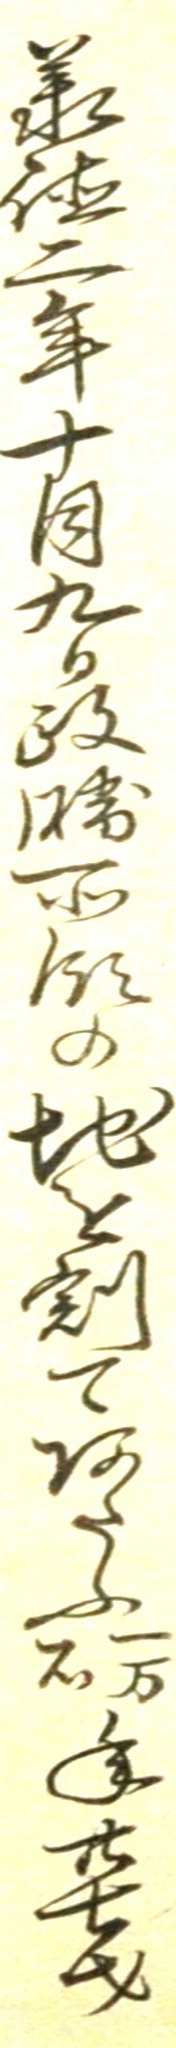承徳二年十月九日政勝所領の地を割てあたふ一万石年廿七才
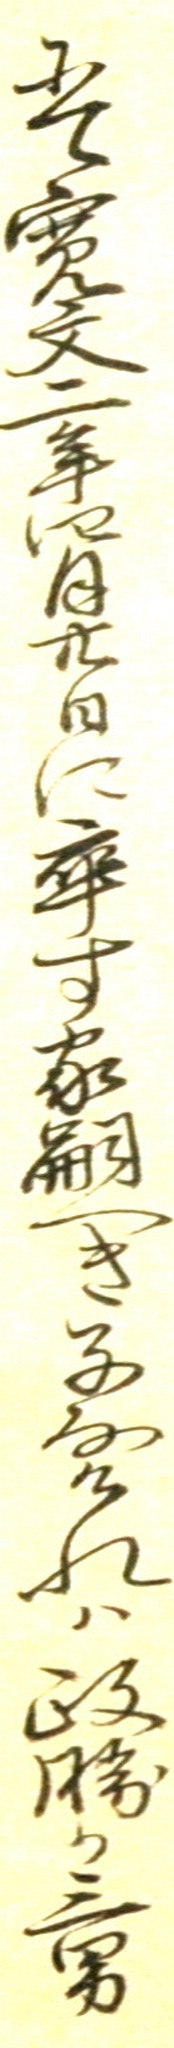にて寛文二年四月廿日に卒す家嗣へき子なけれは政勝か三男

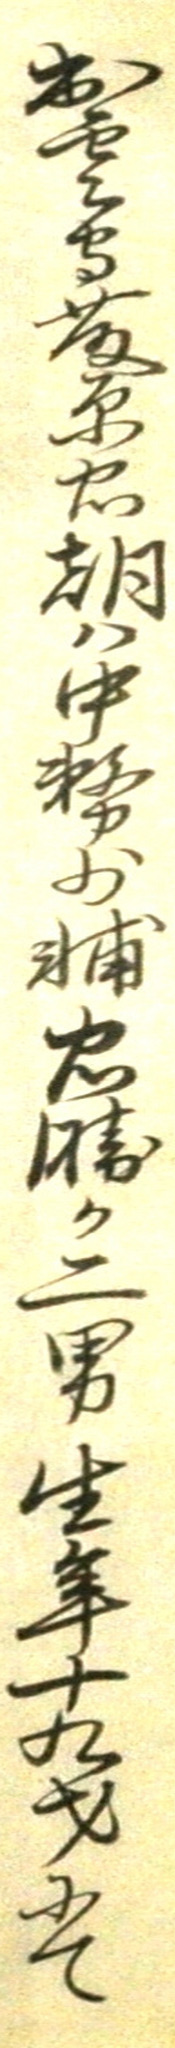出雲守藤原忠朝は中務少輔忠勝か二男生年十九才にて
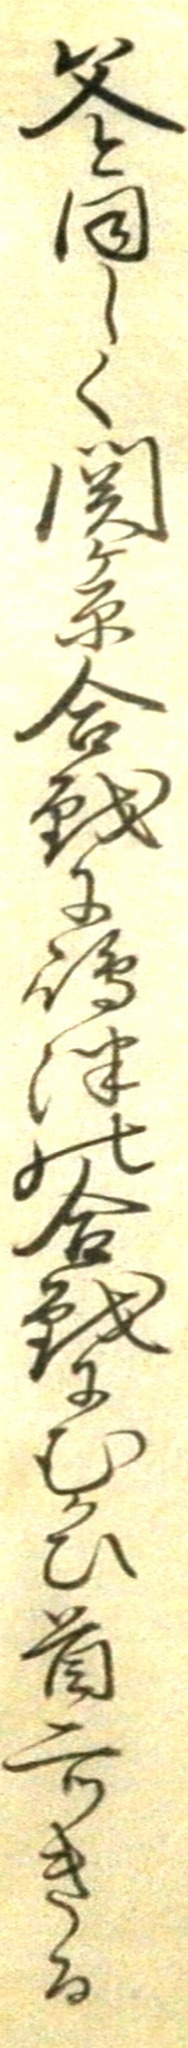父と同しく関ヶ原合戦に島津の合戦にむかひ首二ッきる
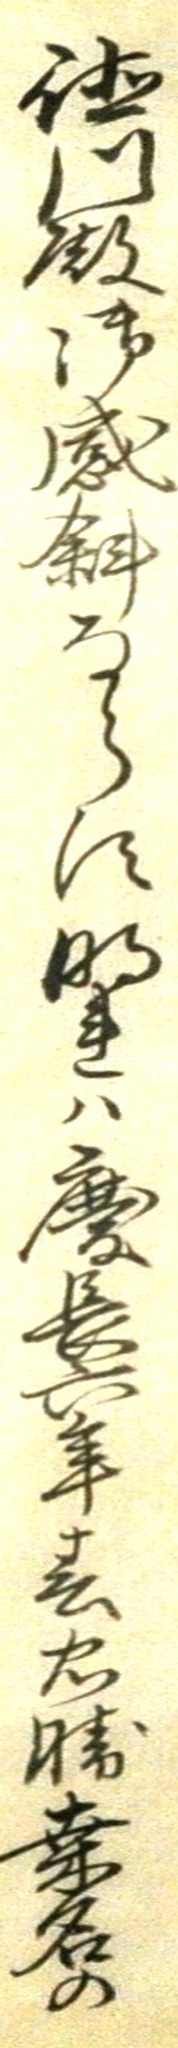徳川殿御感斜ならす明れは慶長六年春忠勝桑名の
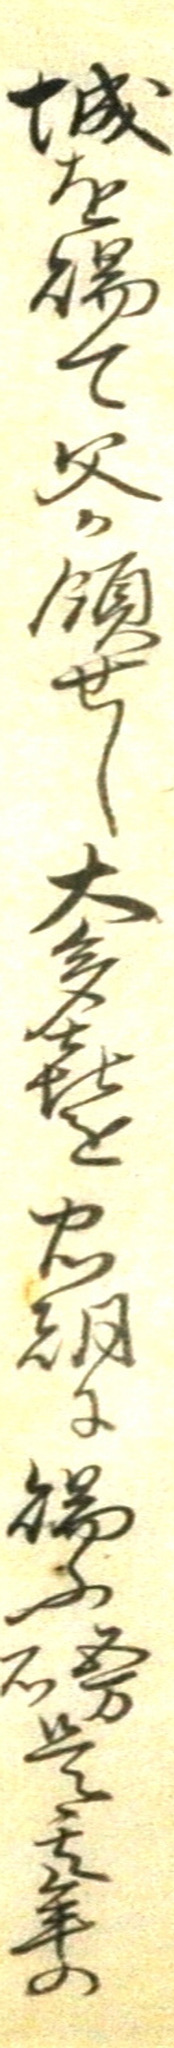城を賜て父か領せし大多喜を忠朝に賜ふ五万石是其年の
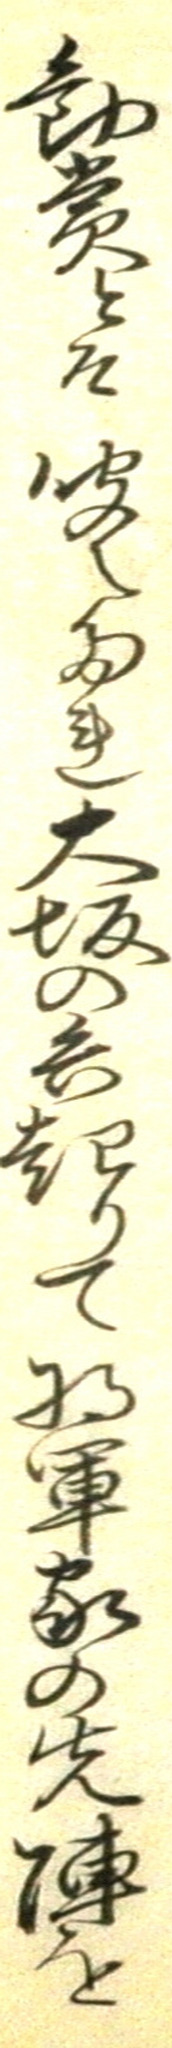勧賞とそ聞えたれ大坂の兵起りて将軍家の先陣を
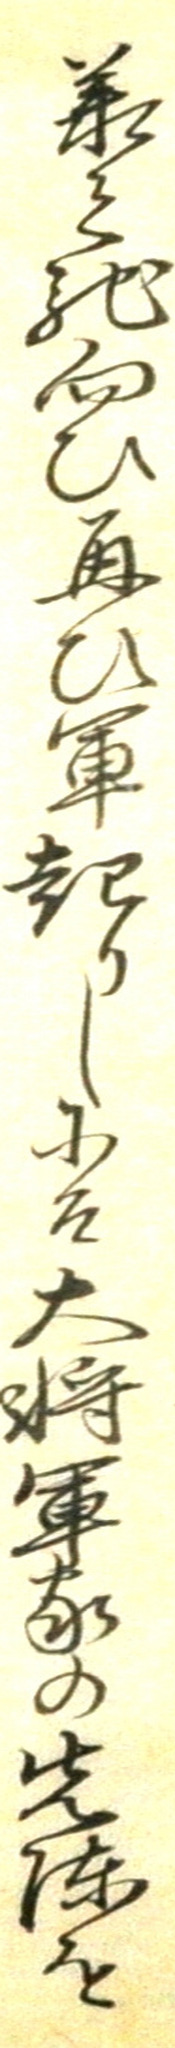承て馳向ひ再ひ軍起りしにそ大将軍家の先陣を
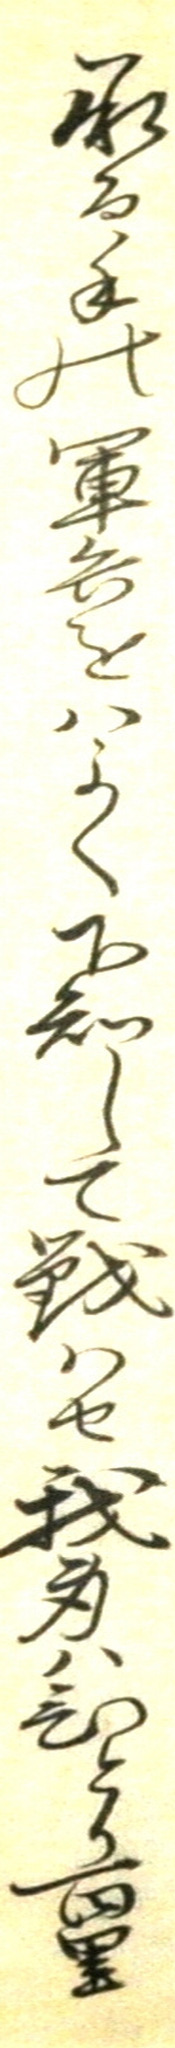承る手の軍兵をはよく下知して戦はせ我身はひとり百里
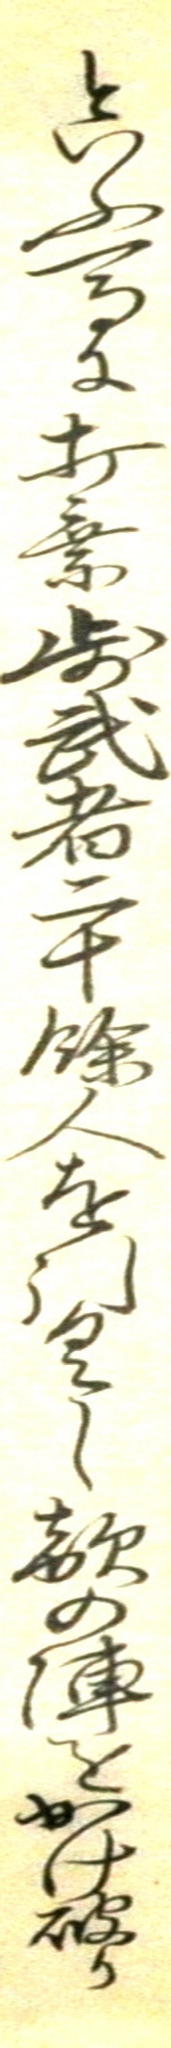といふ馬に打乗歩武者二十余人を引具し敵の陣をかけ破り
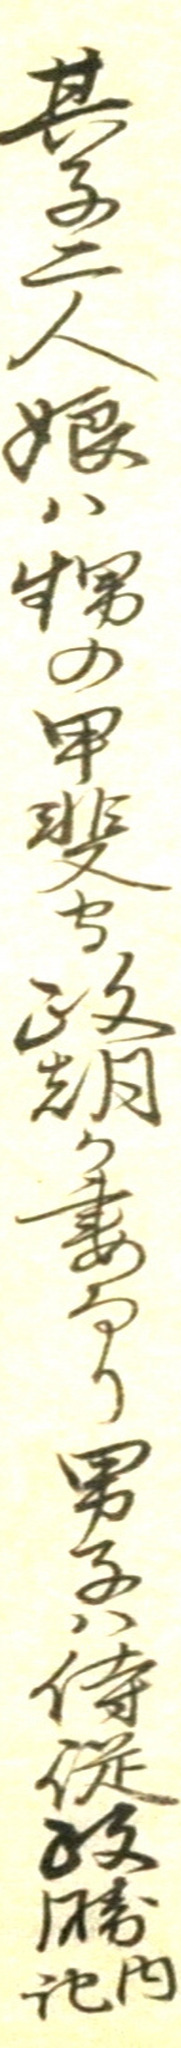其子二人娘は甥の甲斐守政朝か妻なり男子は侍従政勝内記
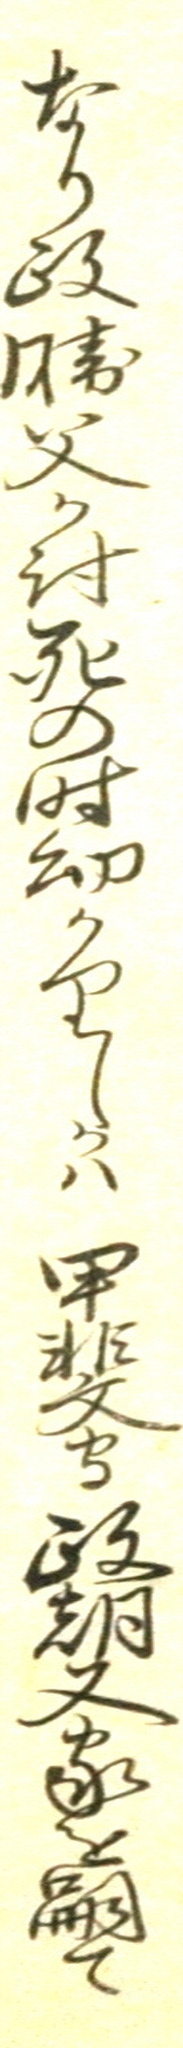なり政勝父か討死の時幼かりしかは甲斐守政朝又家を嗣て
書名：藩翰譜（四・上）
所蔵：伊那市立高遠町図書館・合同会社AMANE
